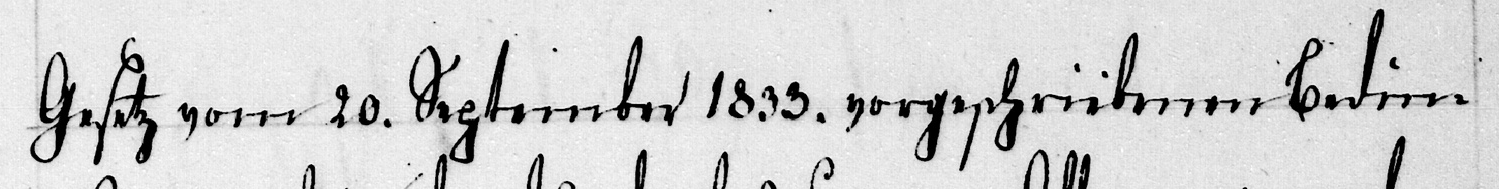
Gesetz vom 20. September 1833. vorgeschriebenen Bedin¬
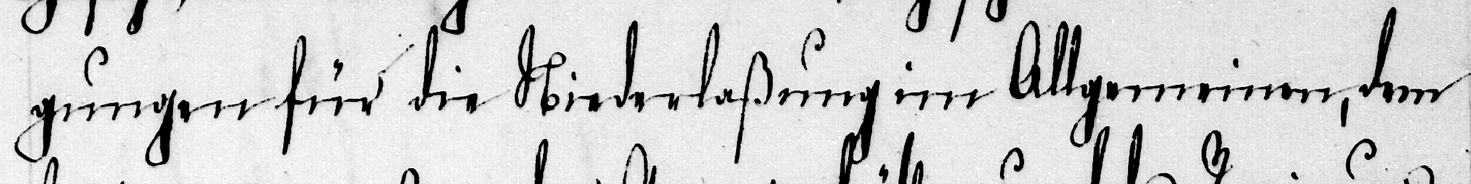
gungen für die Niederlaßung im Allgemeinen, dem
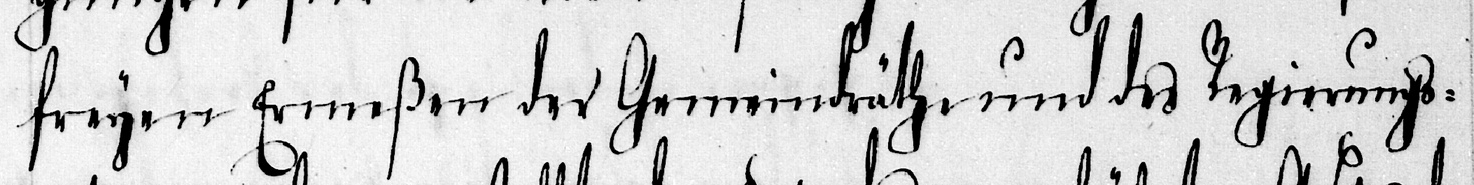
freyen Ermeßen der Gemeindräthe und des Regierungs¬
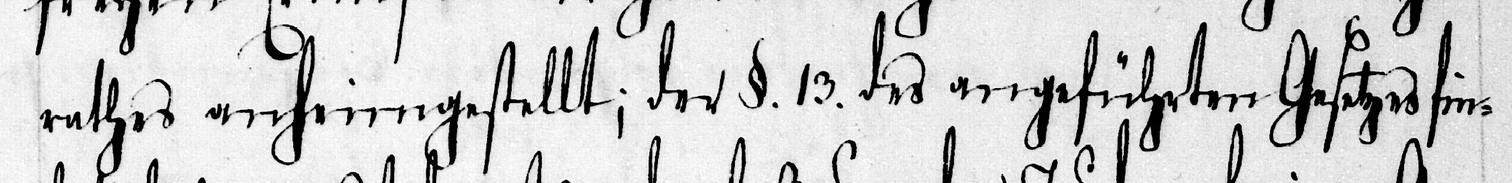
rathes anheimgestellt; der §. 13. des angeführten Gesetzes f¬
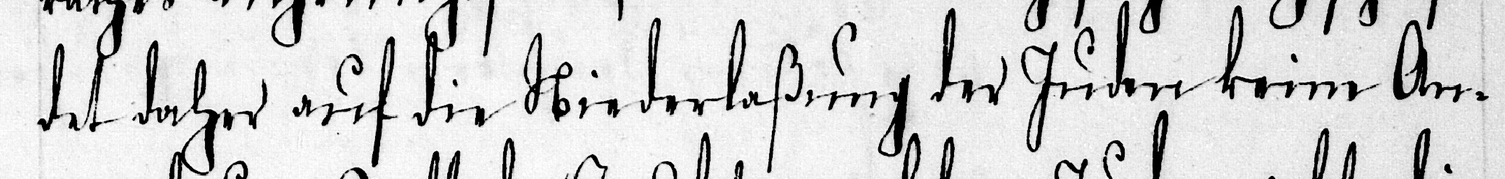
det daher auf die Niederlaßung der Juden keine An¬
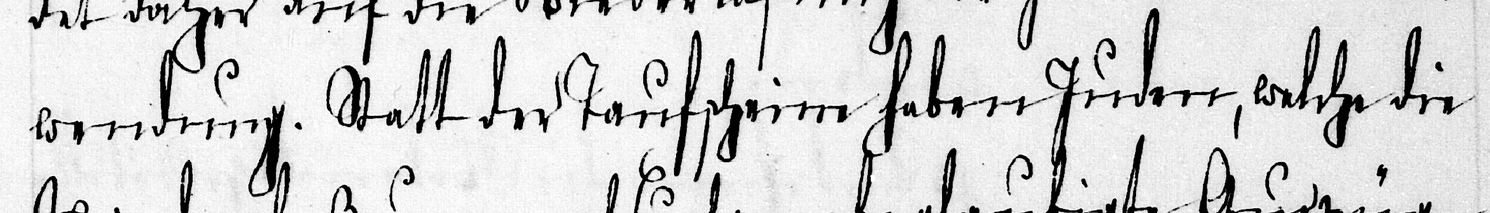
wendung. Statt der Taufscheine haben Juden, welche die
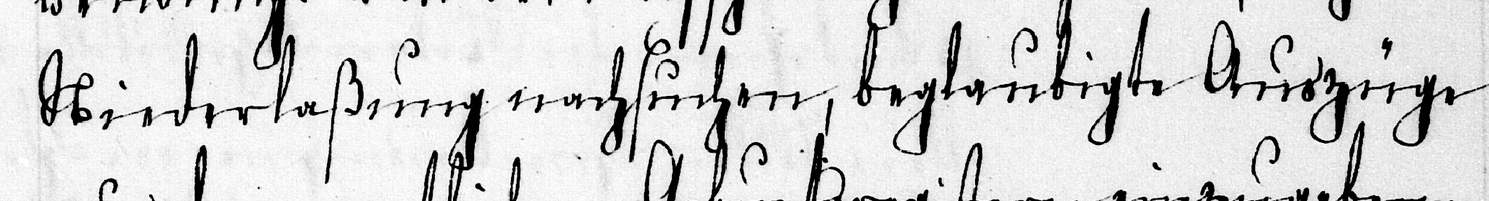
Niederlaßung nachsuchen, beglaubigte Auszüge
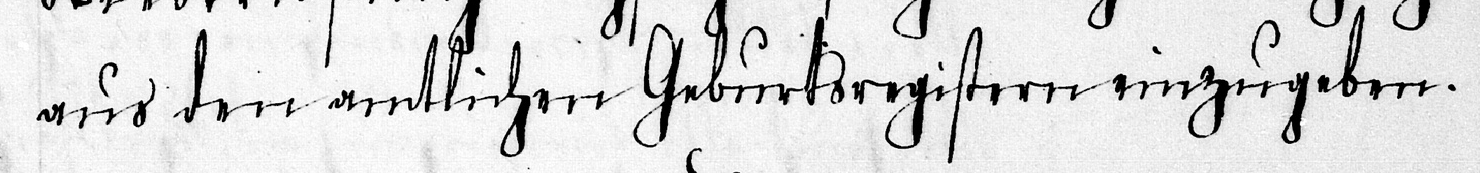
aus den amtlichen Geburtsregistern einzugeben.
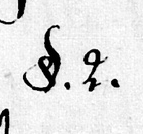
§. 2.
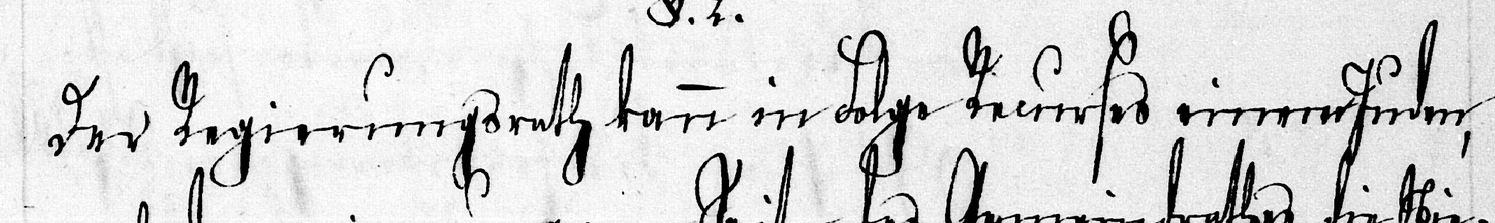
Der Regierungsrath kann in Folge Recurses einem Juden,
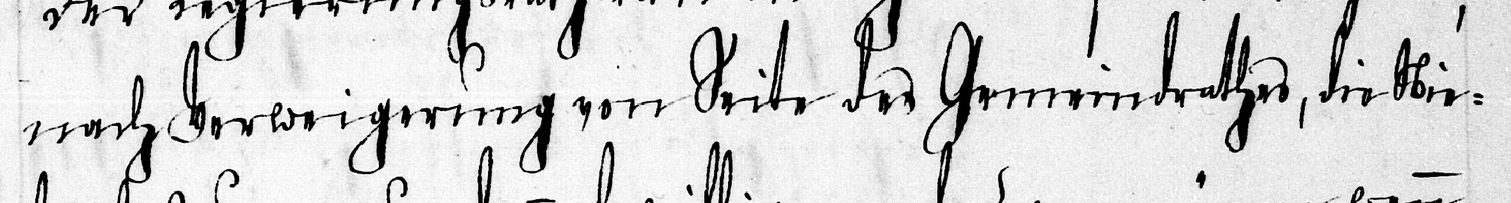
nach Verweigerung von Seite des Gemeindrathes, die Nie¬
